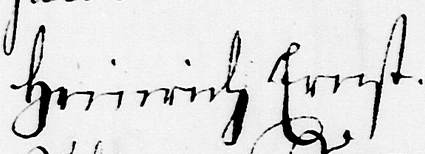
Heinrich Ernst.
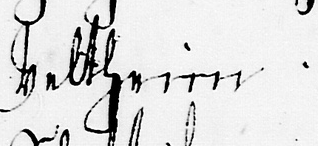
Veltheim
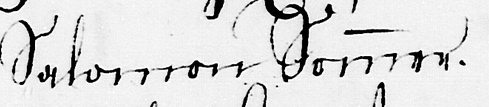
Salomon Sommer.
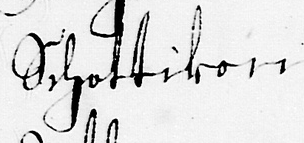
Schottikon
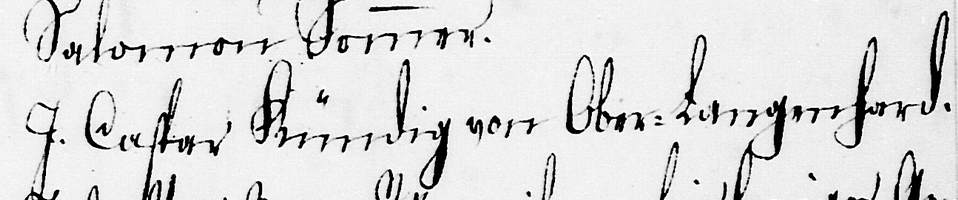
J. Caspar Kündig von Ober-Langenhard.
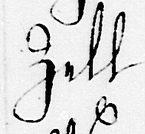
Zell
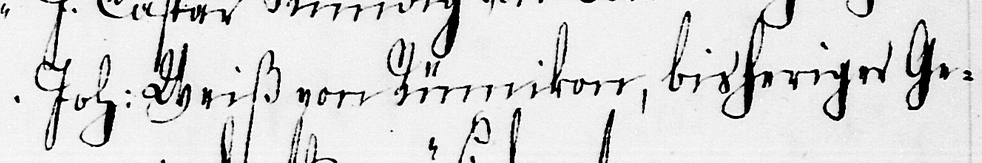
Joh. Weiß von Rümikon, bisheriger Ge¬
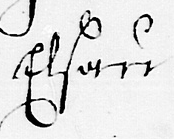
Elsau
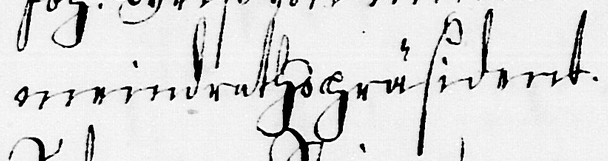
meindrathspräsident.
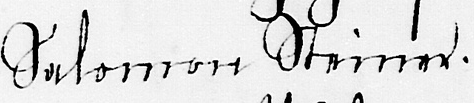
Salomon Steiner.
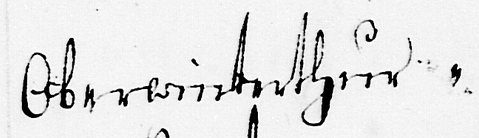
Oberwinterthur
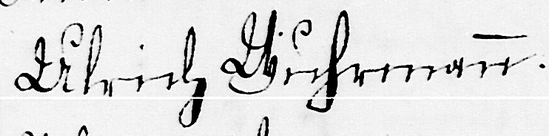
Ulrich Wuhrmann.
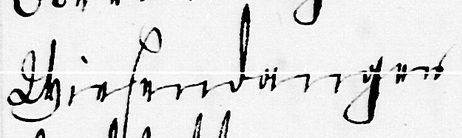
Wiesendangen
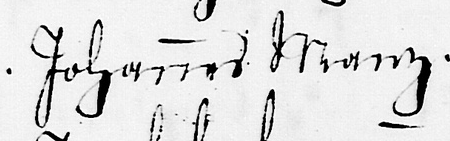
Johannes Manz.
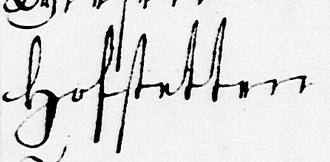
Hofstetten
